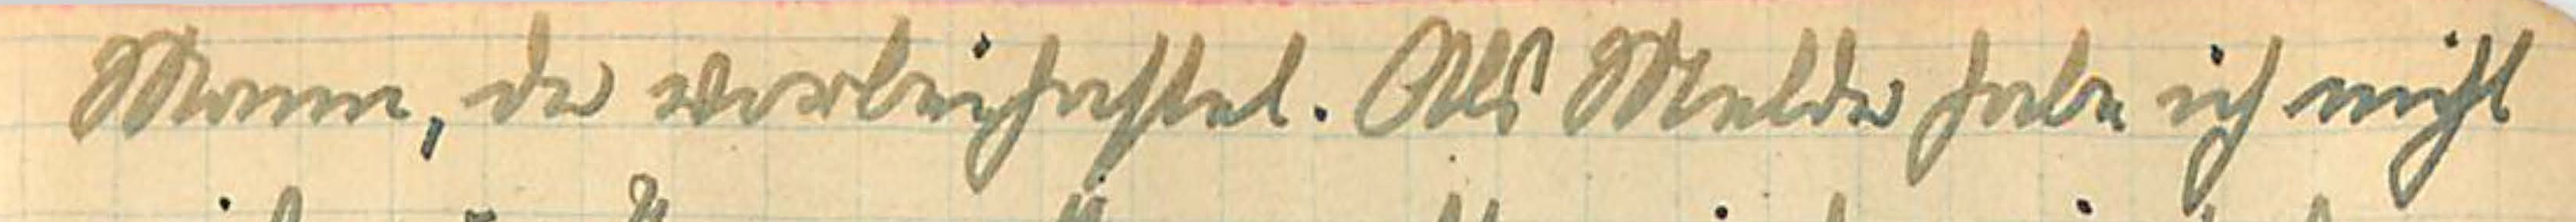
Mann, der vorbeihastet. Als Melder habe ich nicht
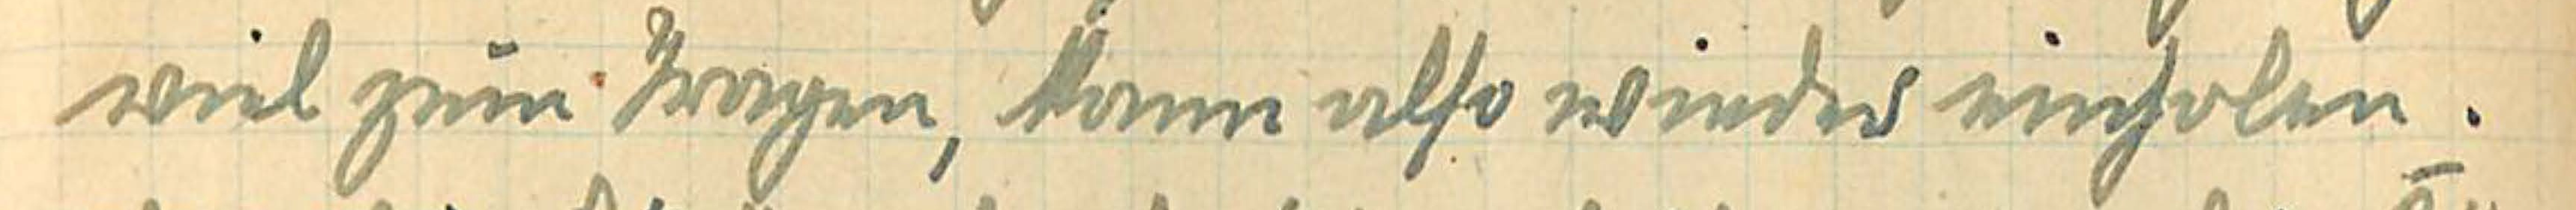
viel zum Tragen, kann also wieder einholen.
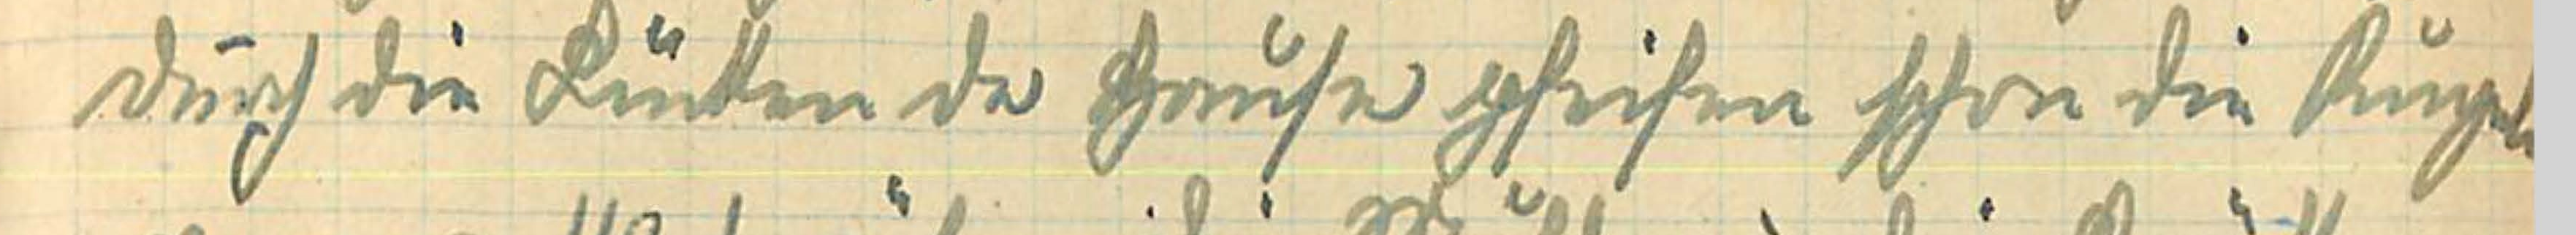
Durch die Lücken der Hauser pfeifen schon die Kugeln
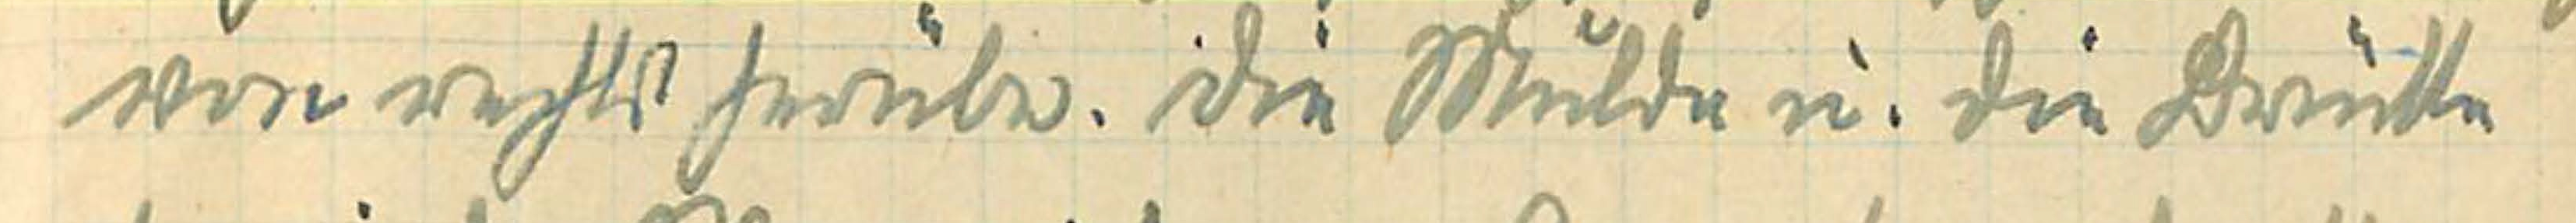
von rechts herüber. Die Mulde u. die Brücke
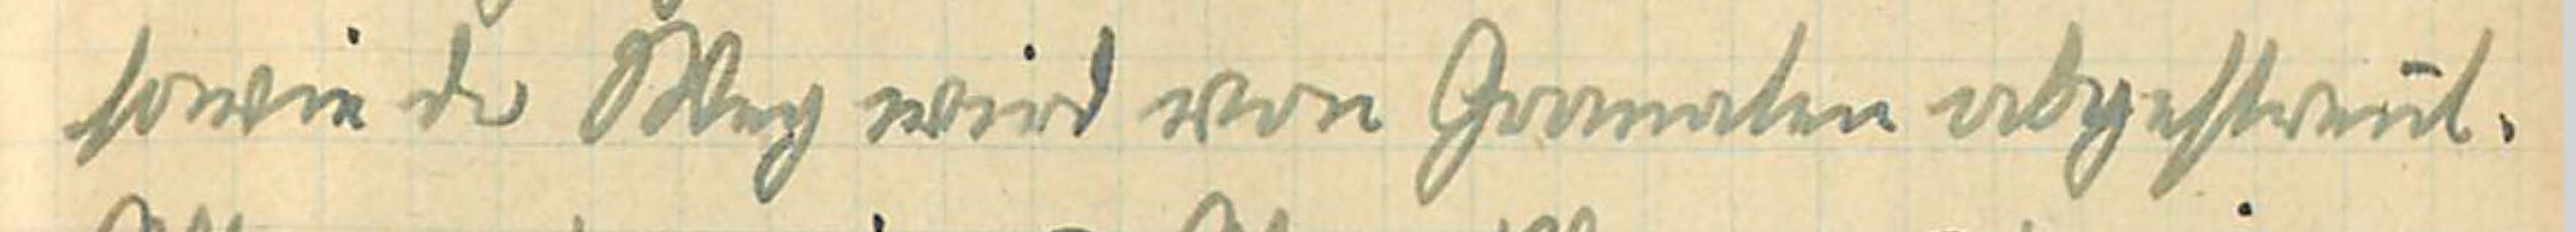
sowie der Weg wird von Granaten abgestreut.
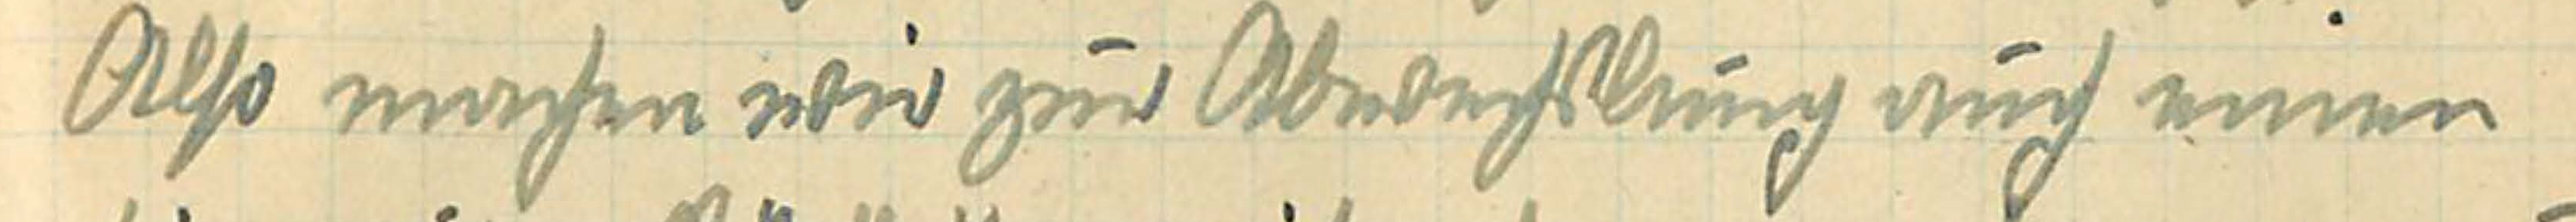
Also machen wir zur Abwechslung auch einen
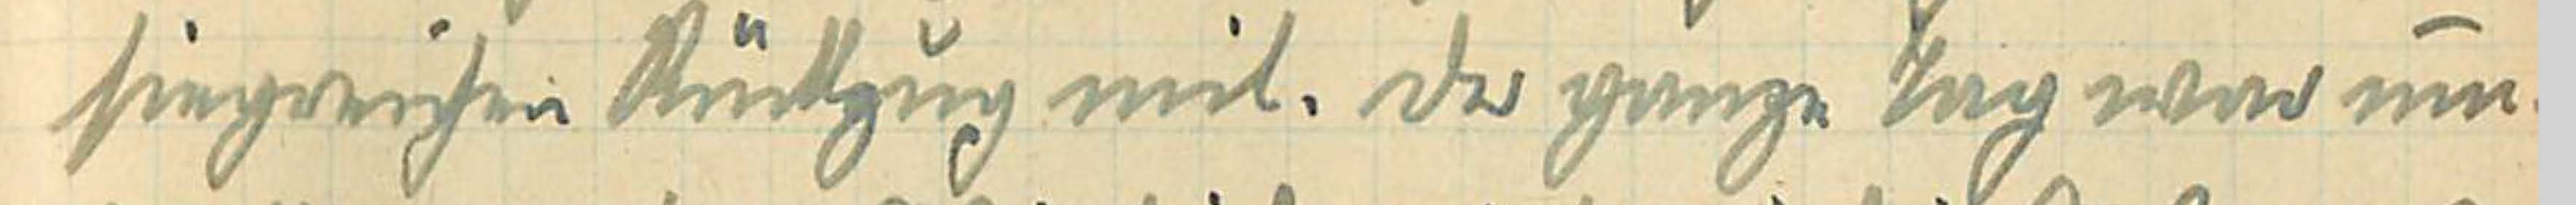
siegreichen Rückzug mit. Der ganze Tag war um-
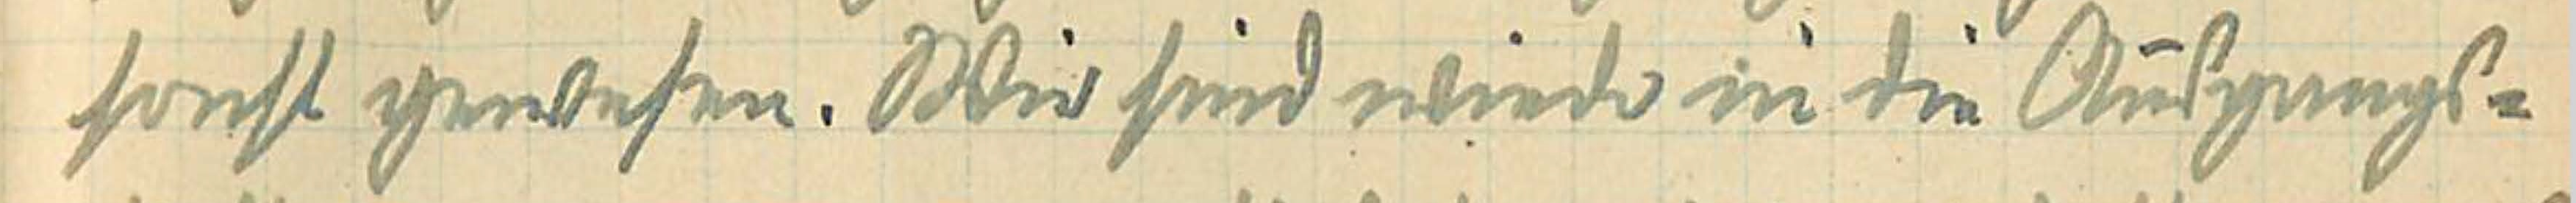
sonst gewesen. Wir sind wieder in die Ausgangs-
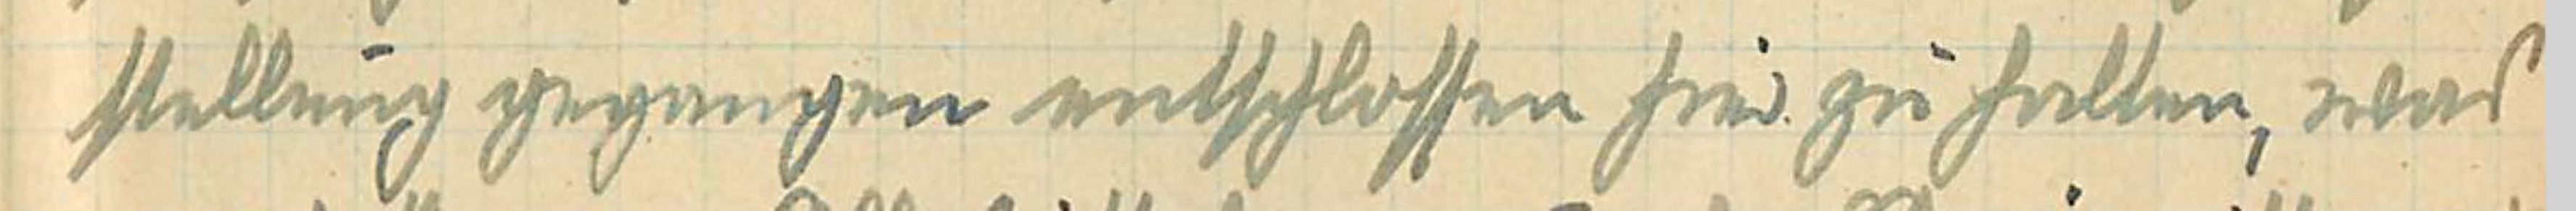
stellung gegangen entschlossen hier zu halten, was
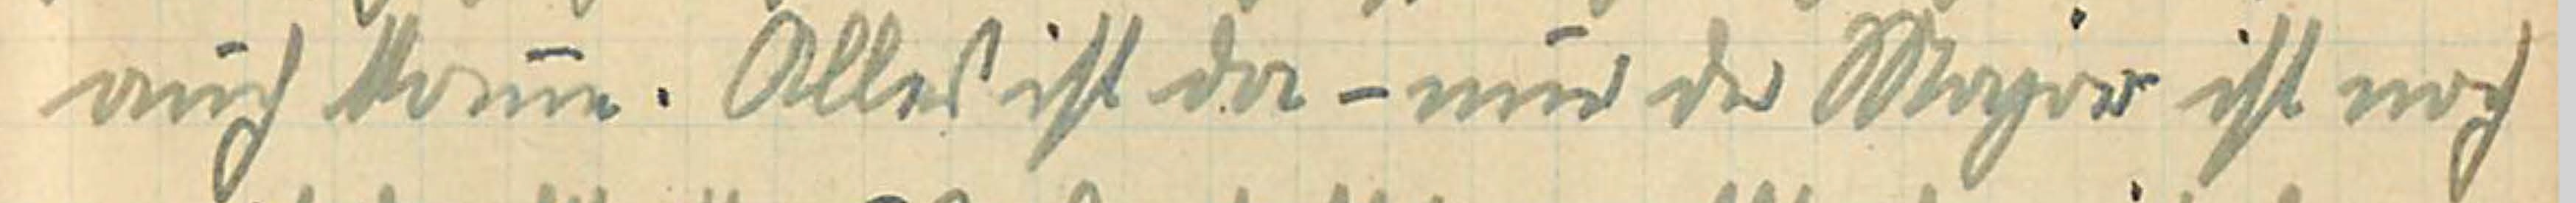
auch komme. Alles ist da – nur der Major ist noch
